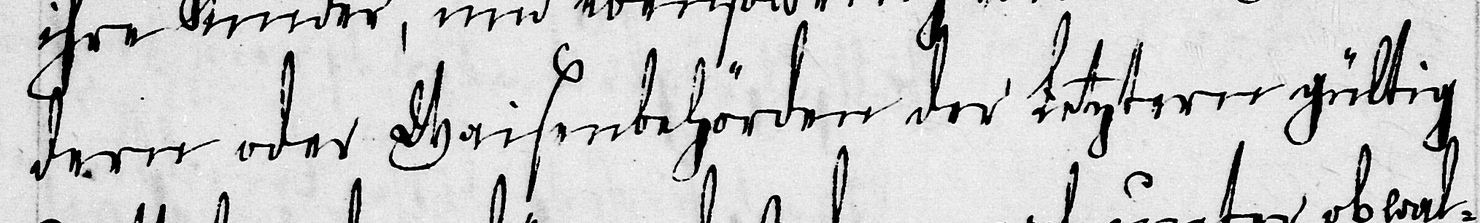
dern oder Waisenbehörden der Letztern gültig
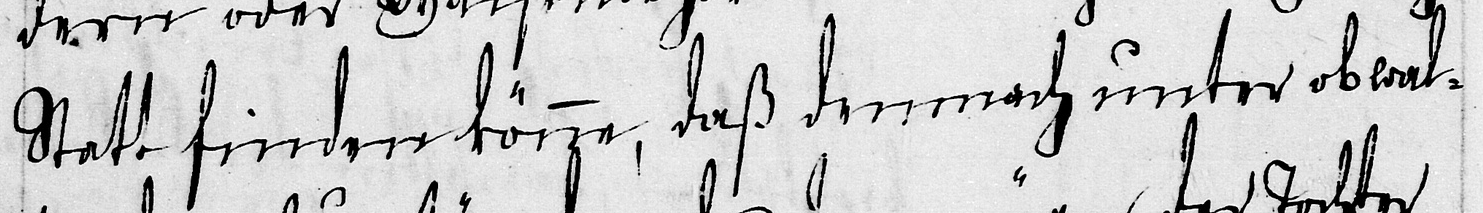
Statt finden könne, daß demnach unter obwal¬
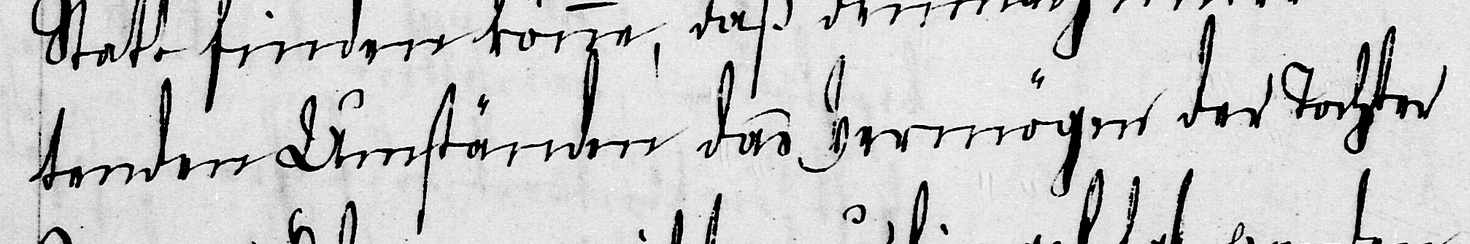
tenden Umständen das Vermögen der Tochter
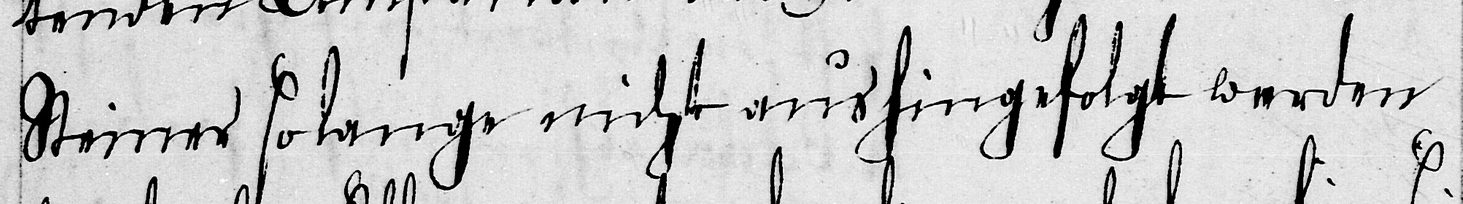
Steiner solange nicht aushingefolgt werden
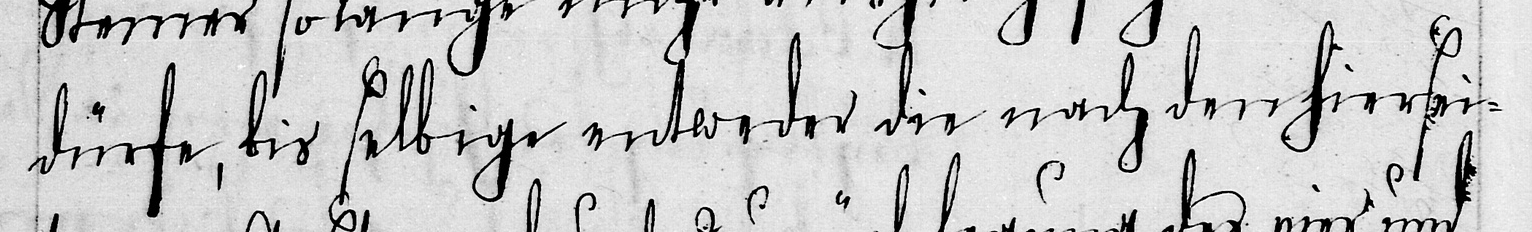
dürfe, bis selbige entweder die nach den hiersei¬
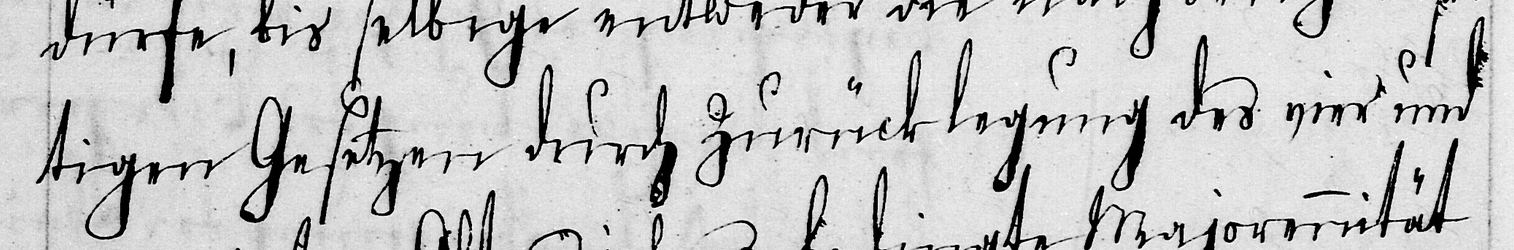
tigen Gesetzen durch Zurücklegung des vier und
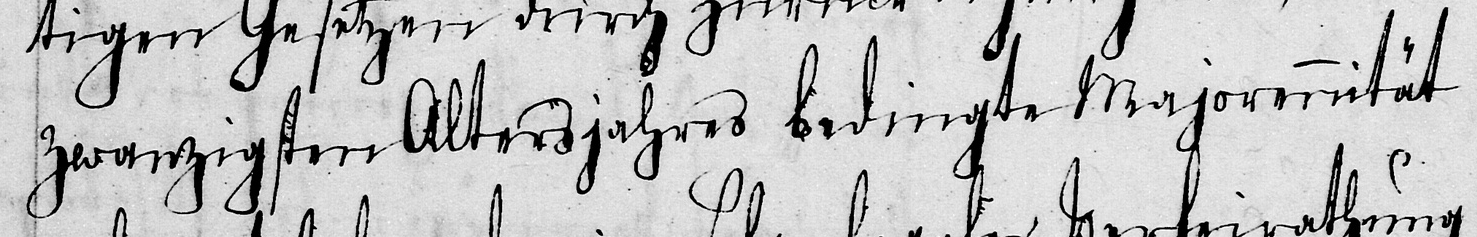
zwanzigsten Altersjahres bedingte Majorennität
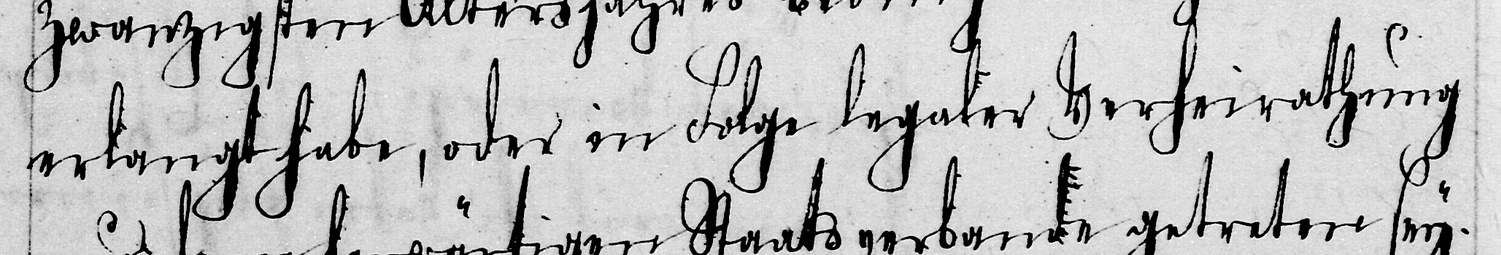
erlangt habe, oder in Folge legaler Verheirathung
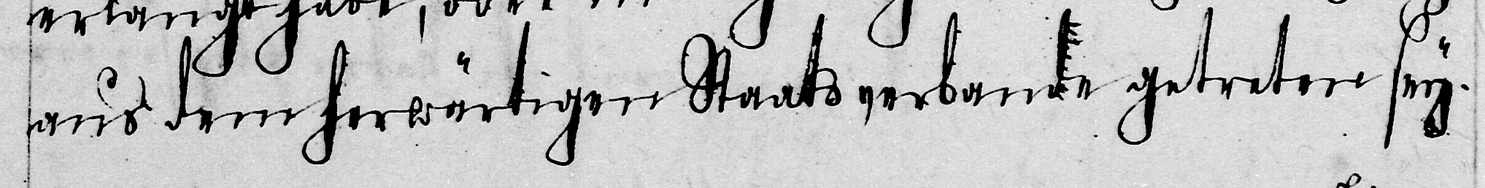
aus dem herwärtigen Staatsverbande getreten sey.
